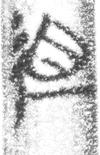組
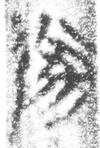○（繸）
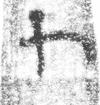七
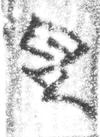見
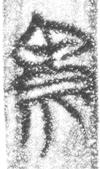鬼
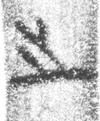之
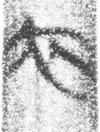衣
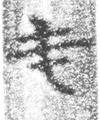屯
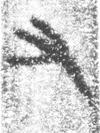又（有）
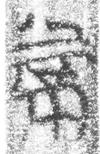常（裳）
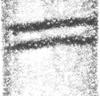二
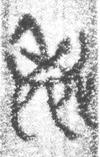○（篦）
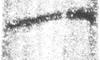一
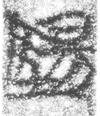○（陽）
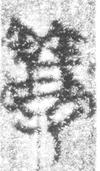笲
